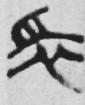卒B
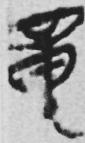章
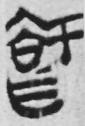智（知）
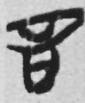言
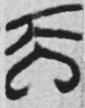而
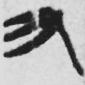又（有）
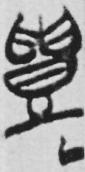豊（禮）
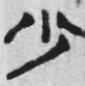少（小）
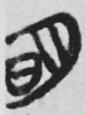明
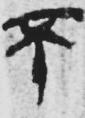不
